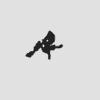欽
